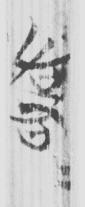左右=
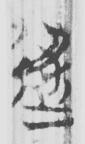逐
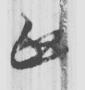臣
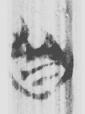皆
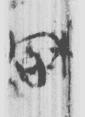和
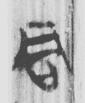同
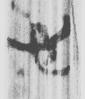心
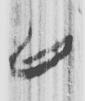㠯（以）
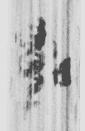{鼠一}
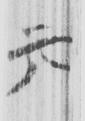亓
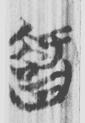智
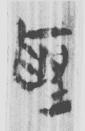聖
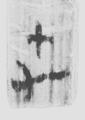{十九}
